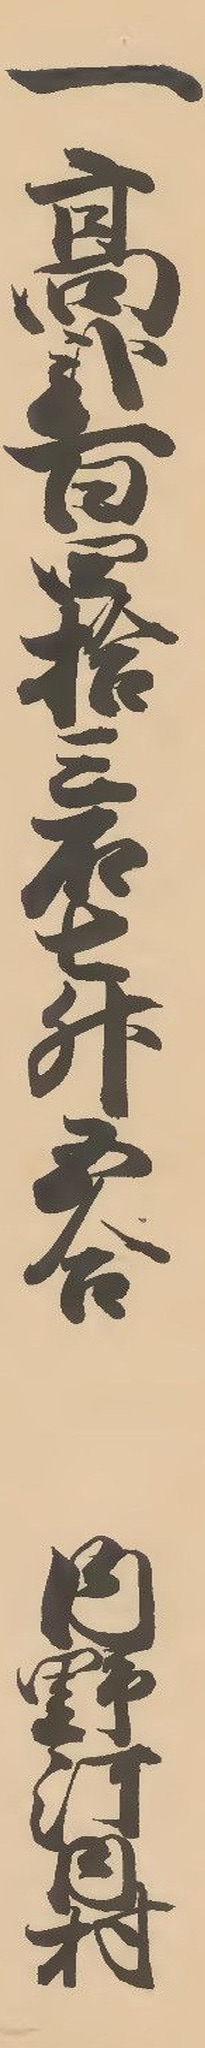一髙弐百四拾三石七升五合内野河内村
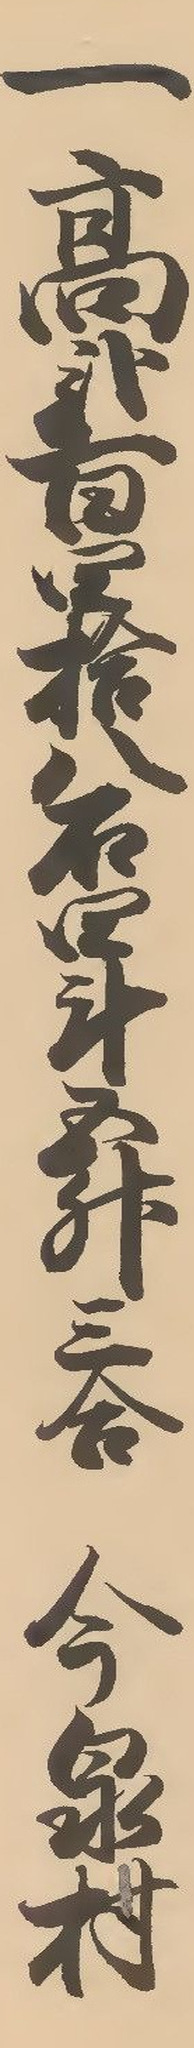一髙弐百四拾八石四斗五升三合今泉村
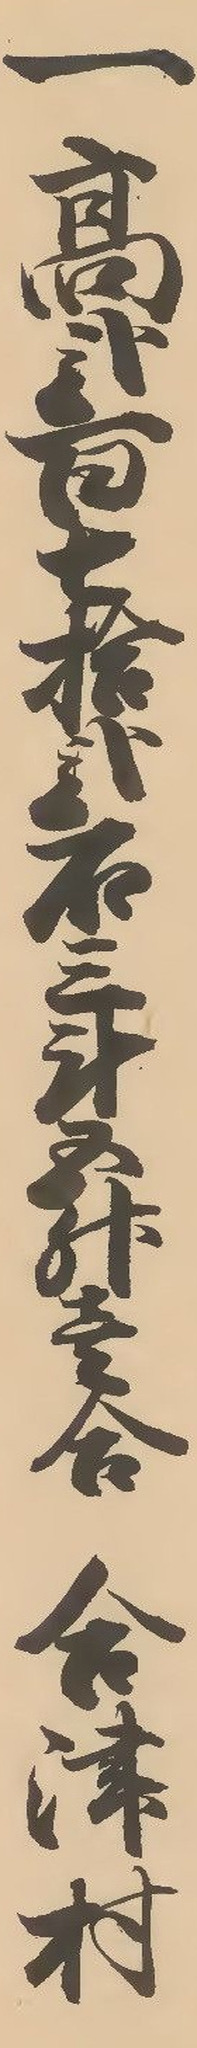一髙弐百七拾弐石三斗五升壱合合津村
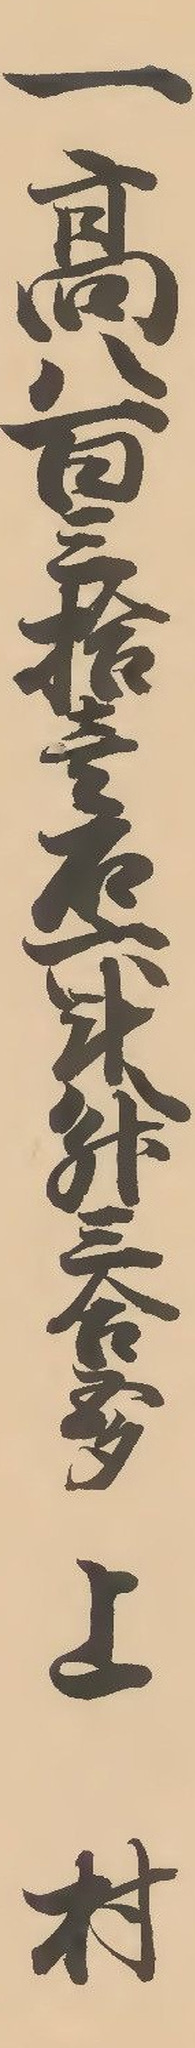一髙八百三拾壱石六斗八升三合五夕上村
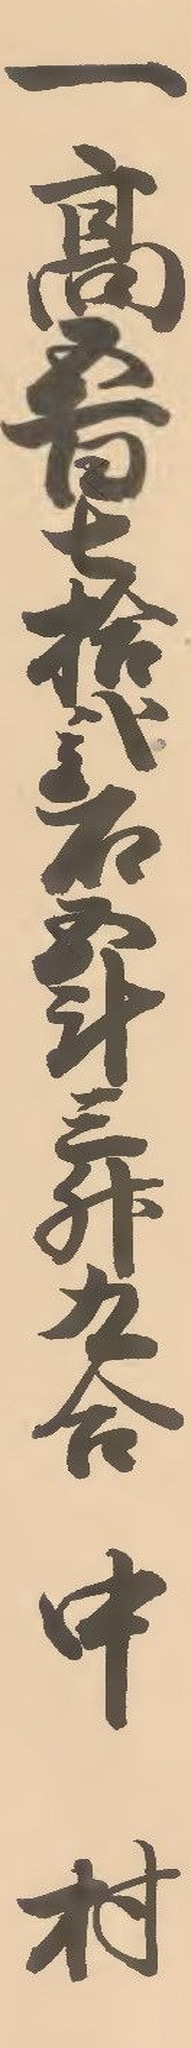一髙五百七拾弐石五斗三升九合中村
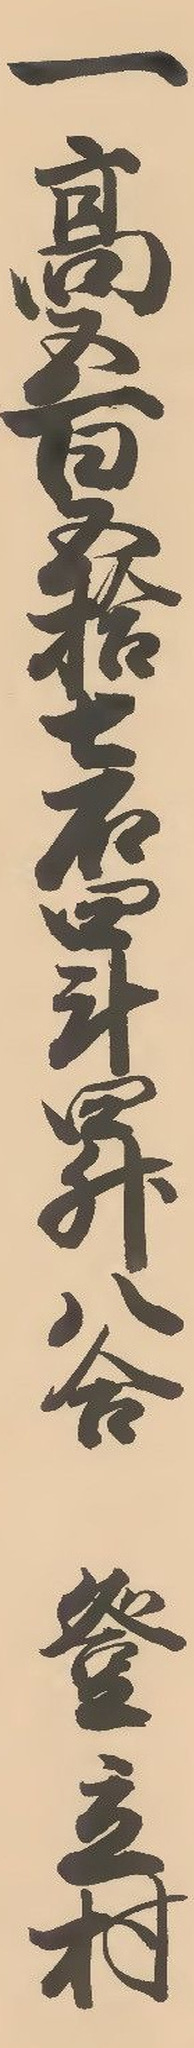一髙五百五拾七石四斗四升八合登立村
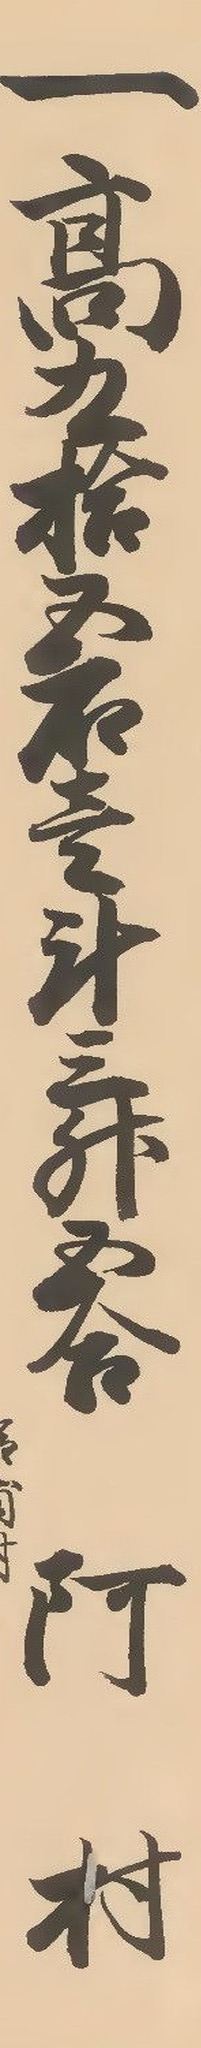一髙九拾五石壱斗三升五合阿村
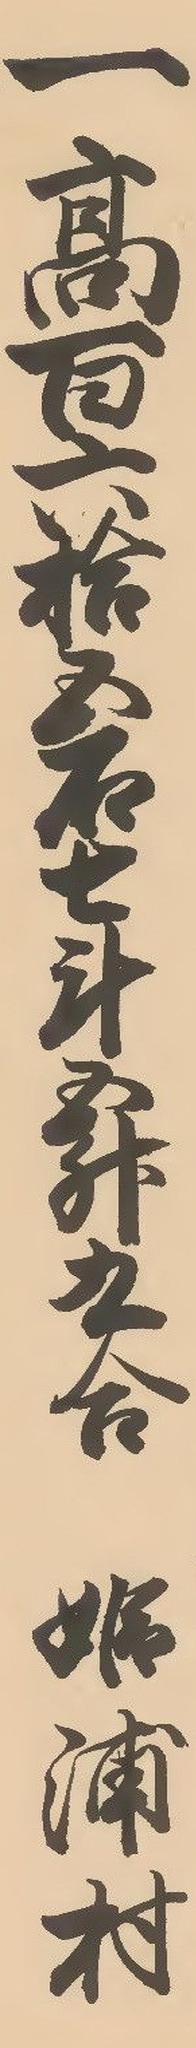一髙百六拾五石七斗五升九合姫浦村

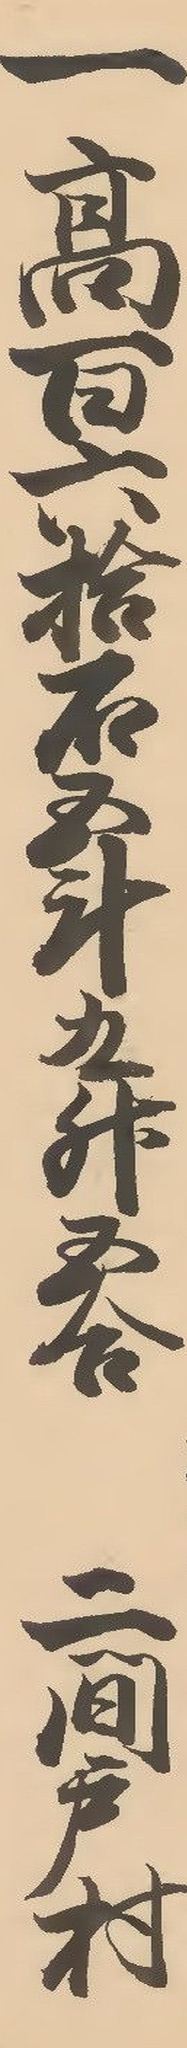一髙百六拾石五斗九升五合二間戸村
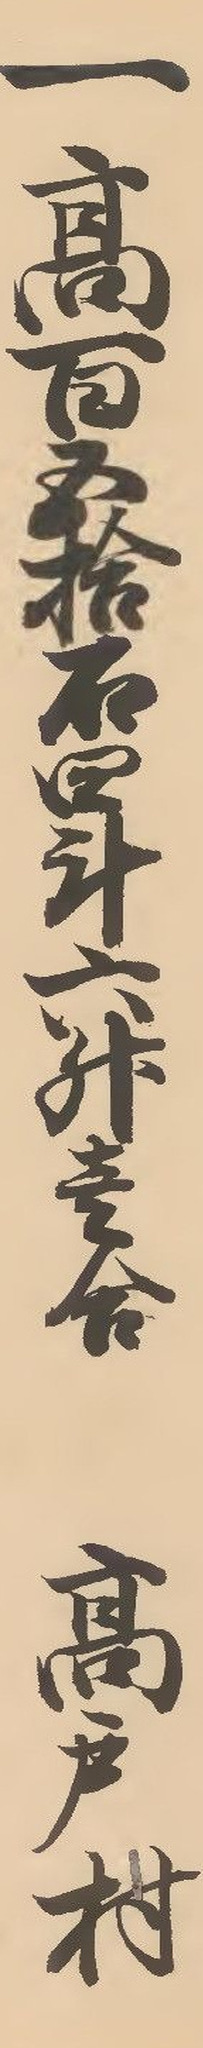一髙百五拾石四斗六升壱合髙戸村
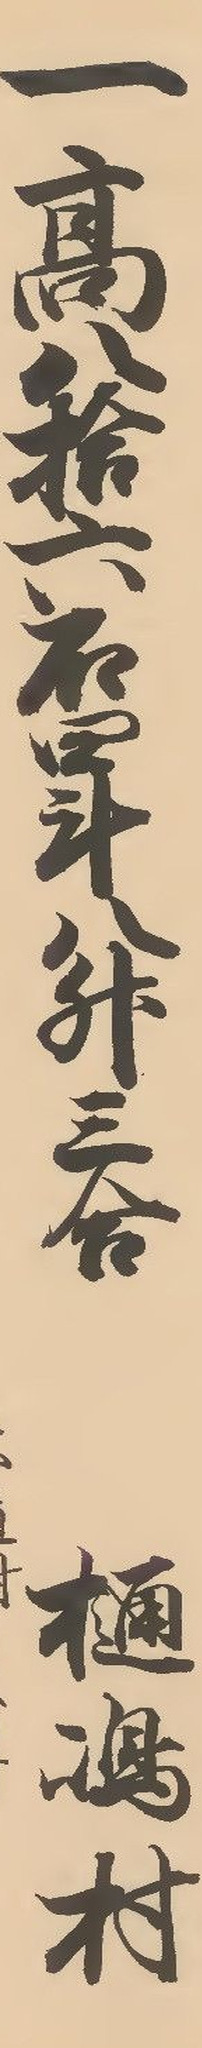一髙八拾六石四斗八升三合樋島村
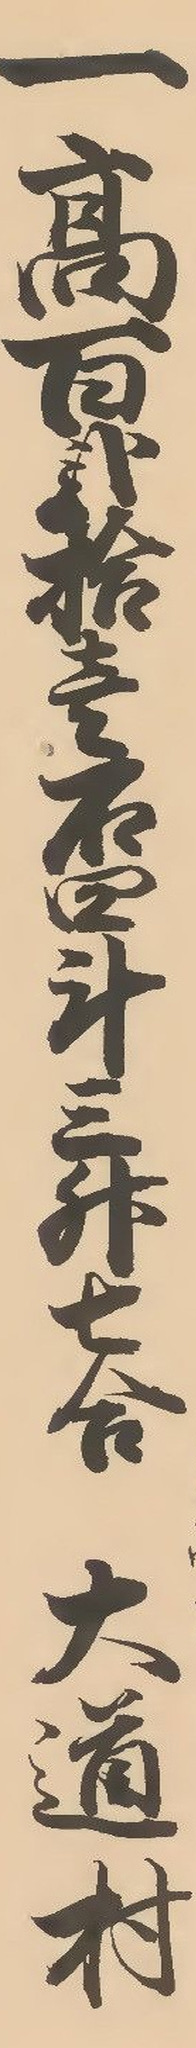一髙百弐拾壱石四斗三升七合大道村
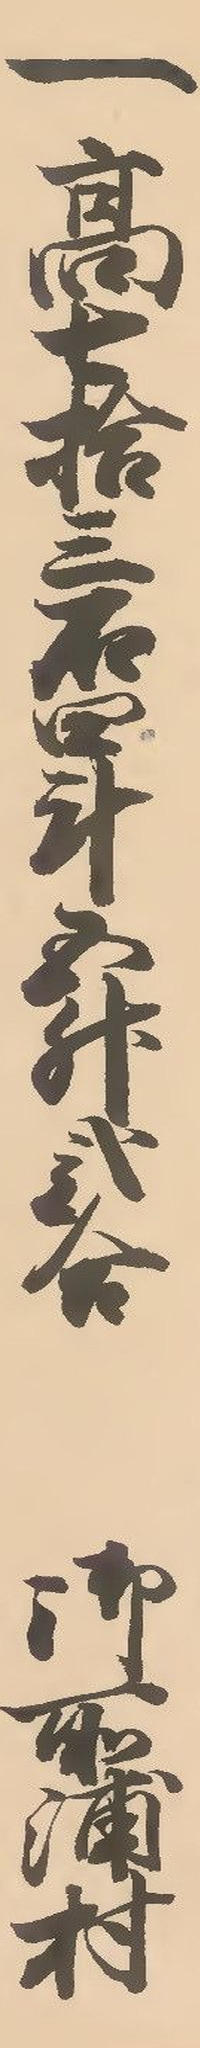一髙七拾三石四斗五升弐合御所浦村
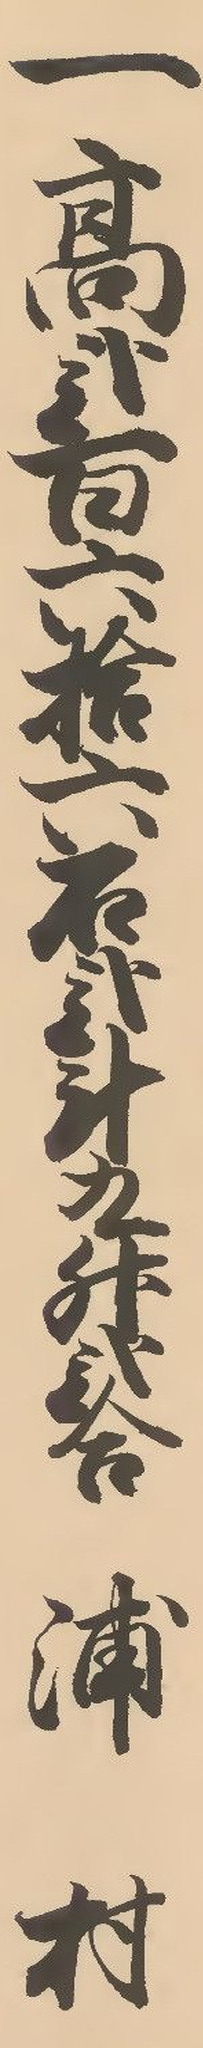一髙弐百六拾六石弐斗九升弐合浦村
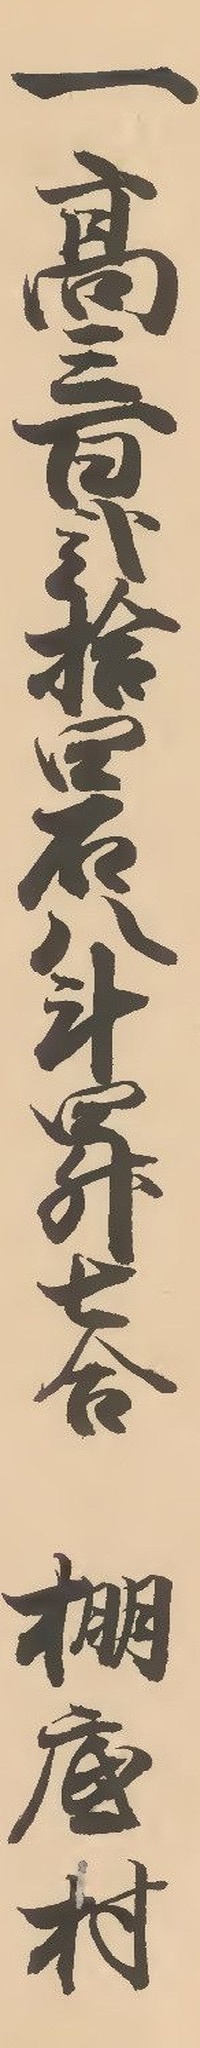一髙三百弐拾四石八斗四升七合棚底村
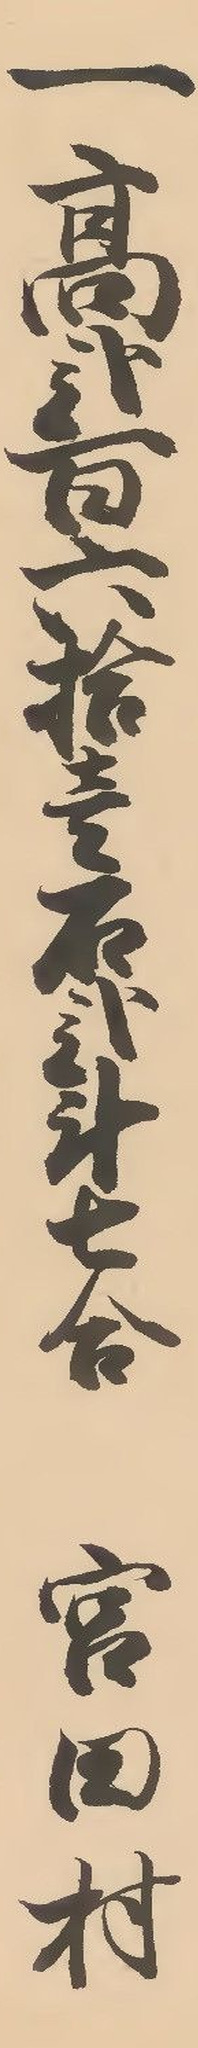一髙弐百六拾壱石弐斗七合宮田村
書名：肥後国郷帳
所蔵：国立公文書館 National Archives of Japan
